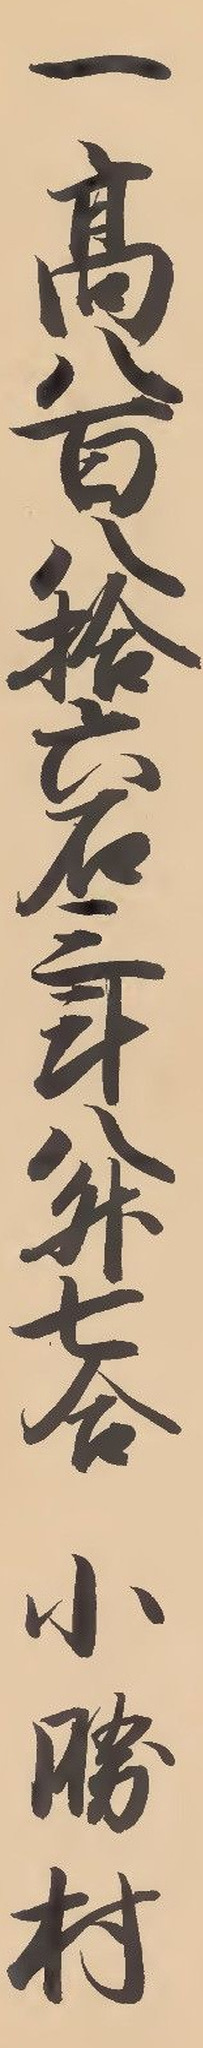一高八百八拾六石三斗八升七合小勝村

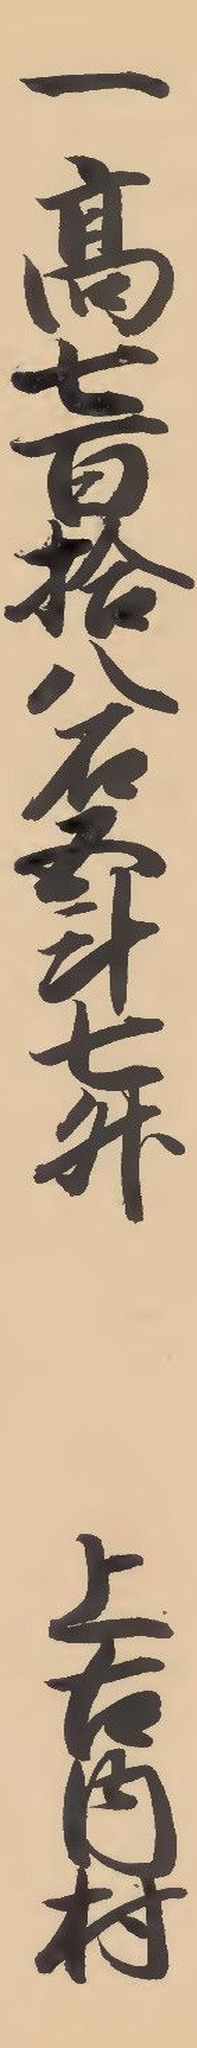一高七百拾八石五斗七升上古内村
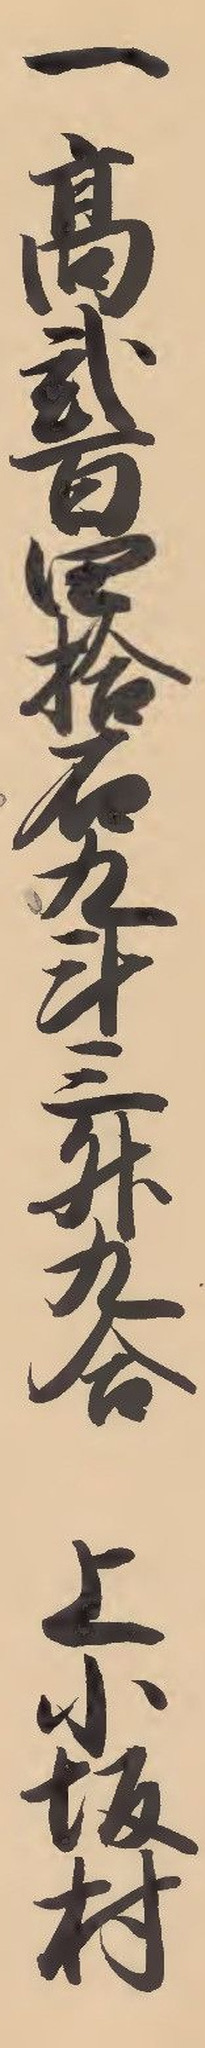一高弐百四拾石九斗三升九合上小坂村
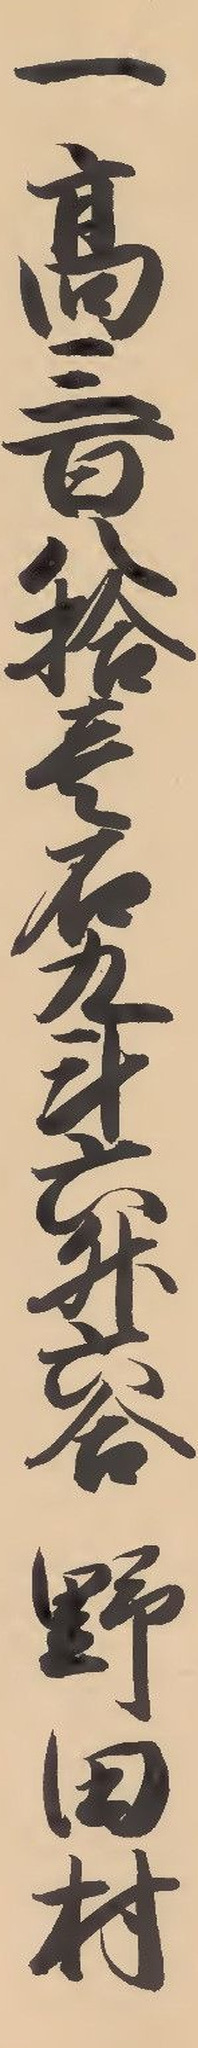一高三百八拾壱石九斗六升六合野田村
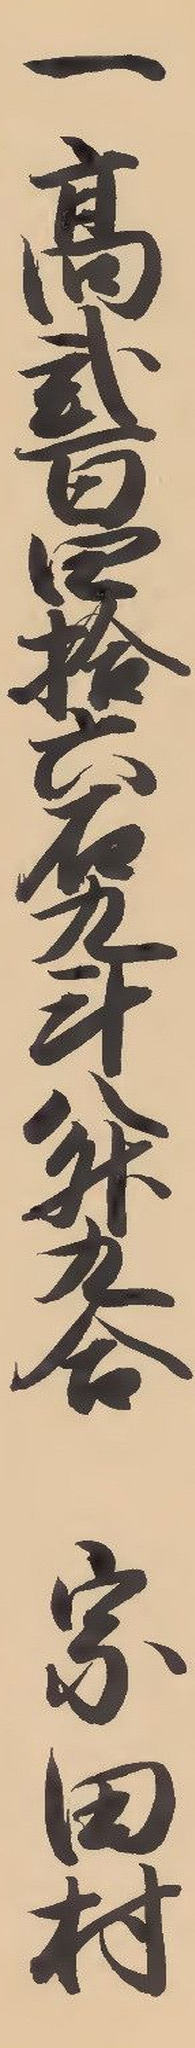一高弐百四拾六石九斗八升九合宗田村
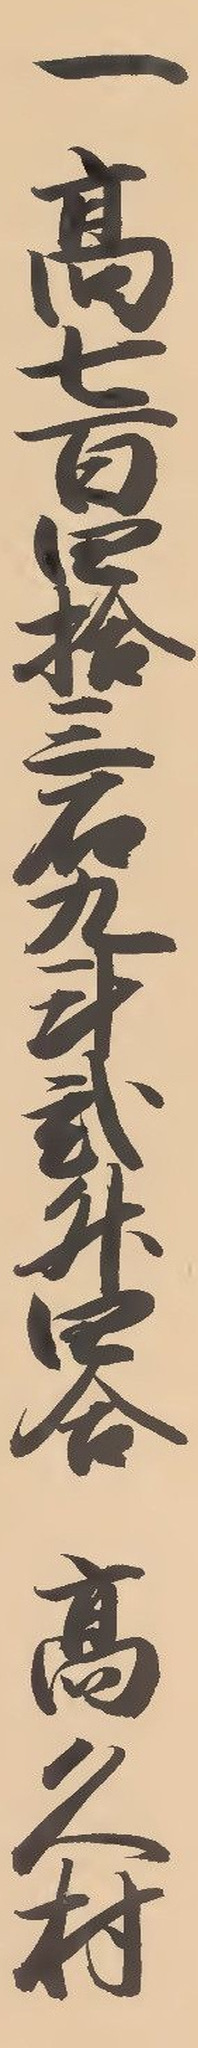一高七百四拾三石九斗弐升四合高久村
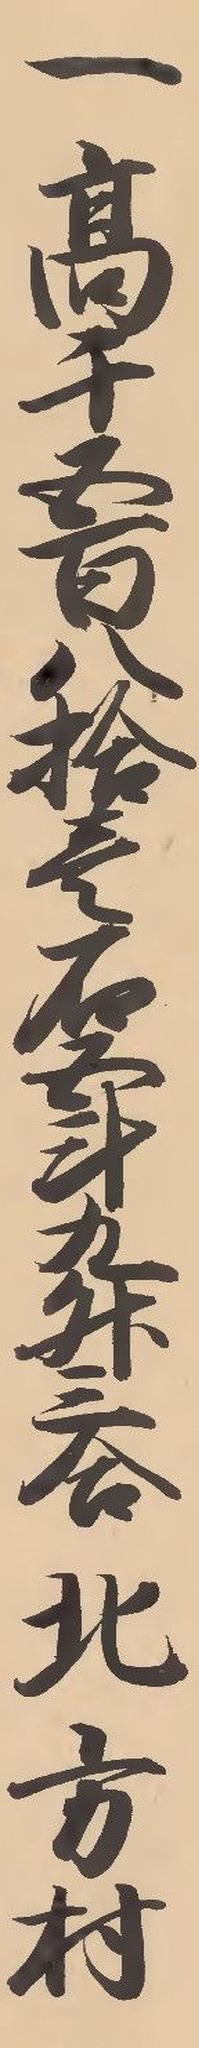一高千五百八拾壱石五斗九升山三合北方村
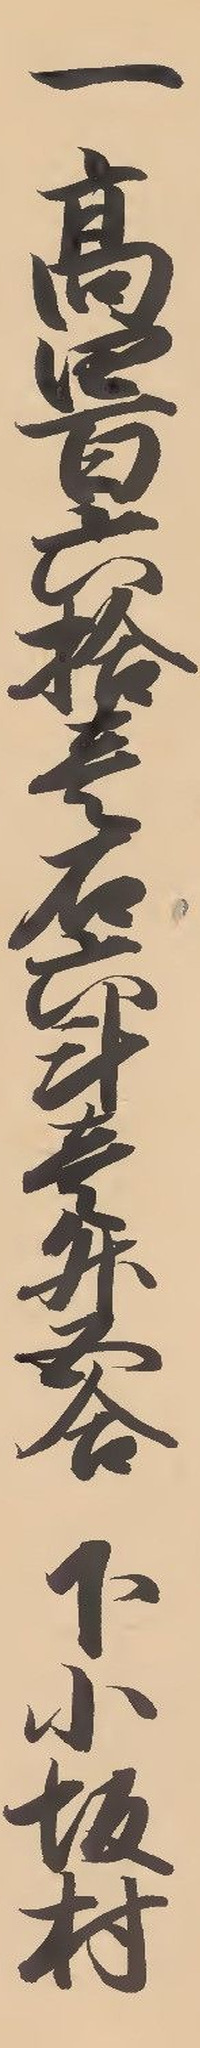一高四百六拾壱石六斗壱升五合下小坂村
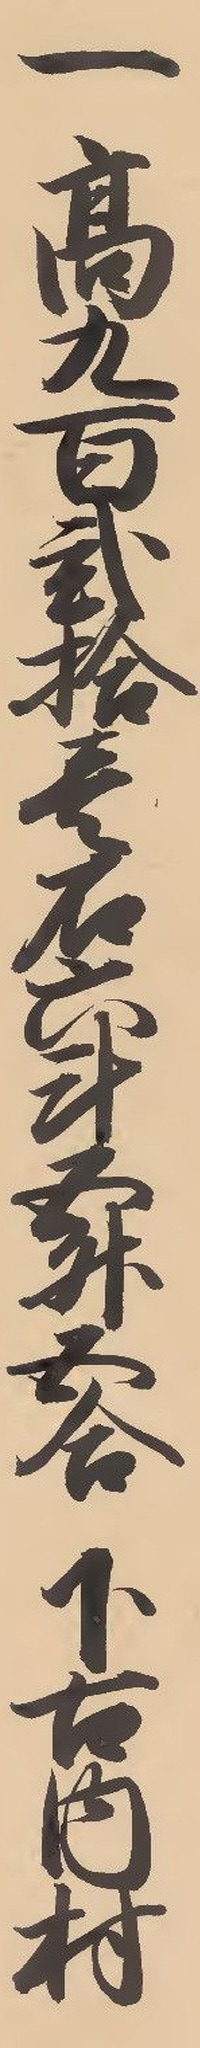一高九百弐拾壱石六斗五升五合下古内村

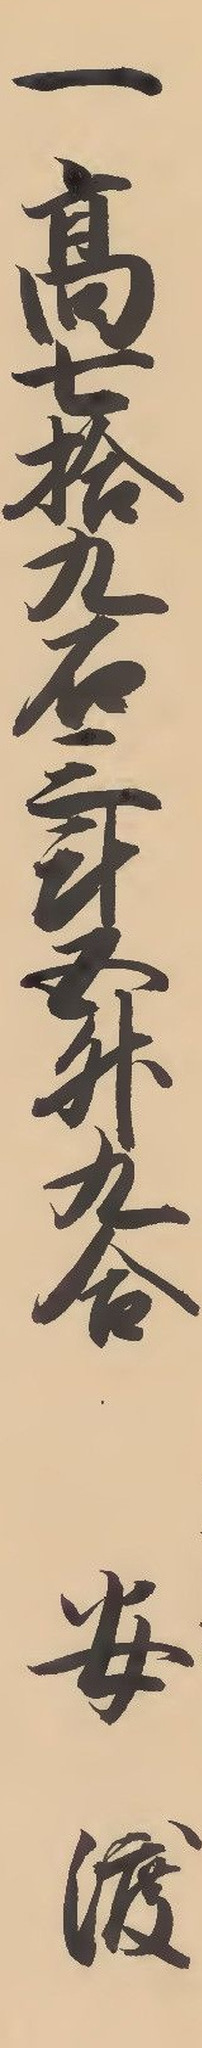一高七拾九石三斗五升九合安渡
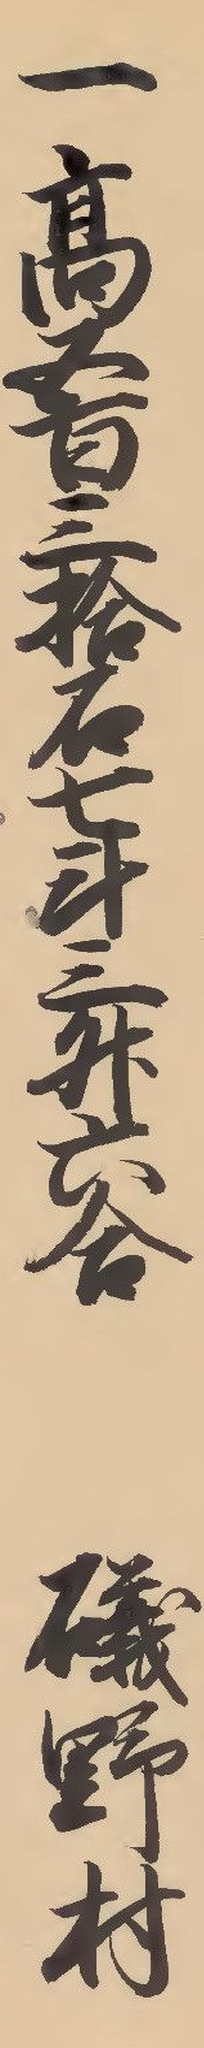一高五百三拾石七斗三升六合磯野村
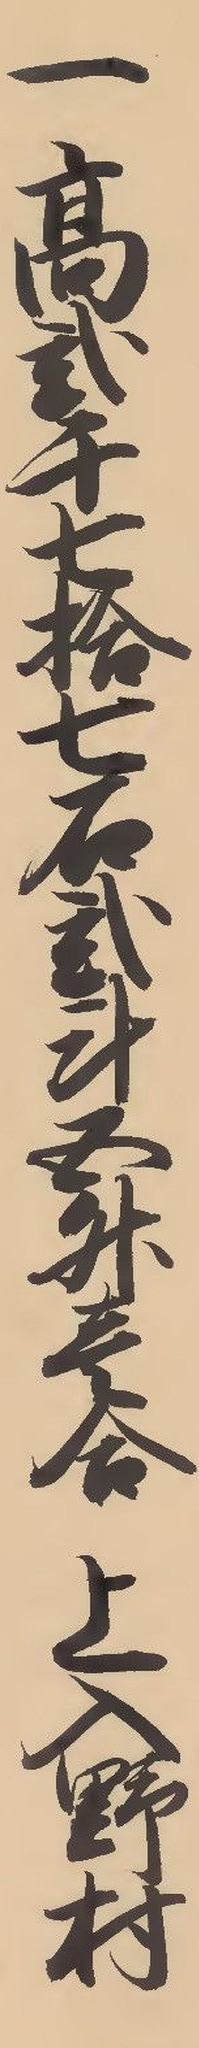一高弐千七拾七石弐斗五升壱合上入野村
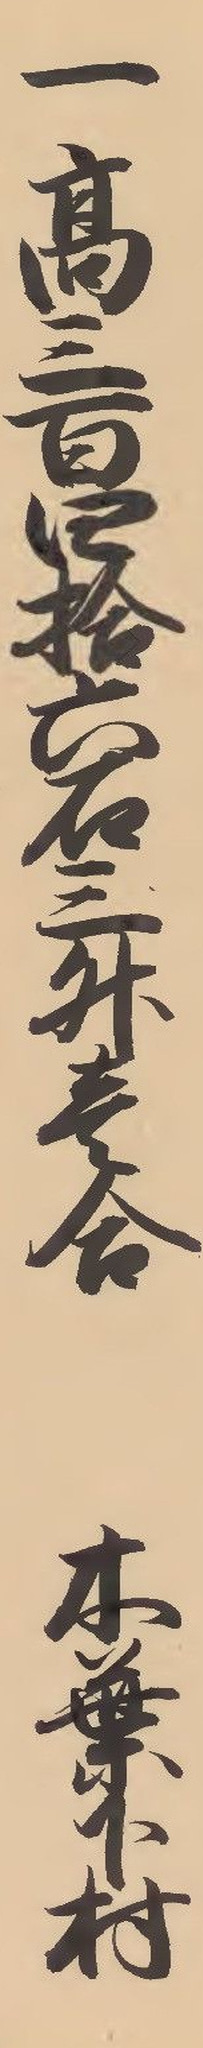一高三百四拾六石三升壱合木葉下村
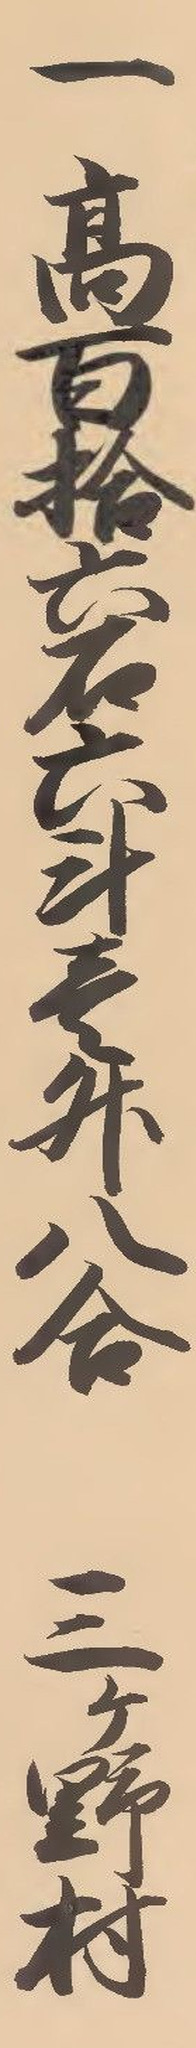一高百拾六石六斗壱升八合三ヶ野村
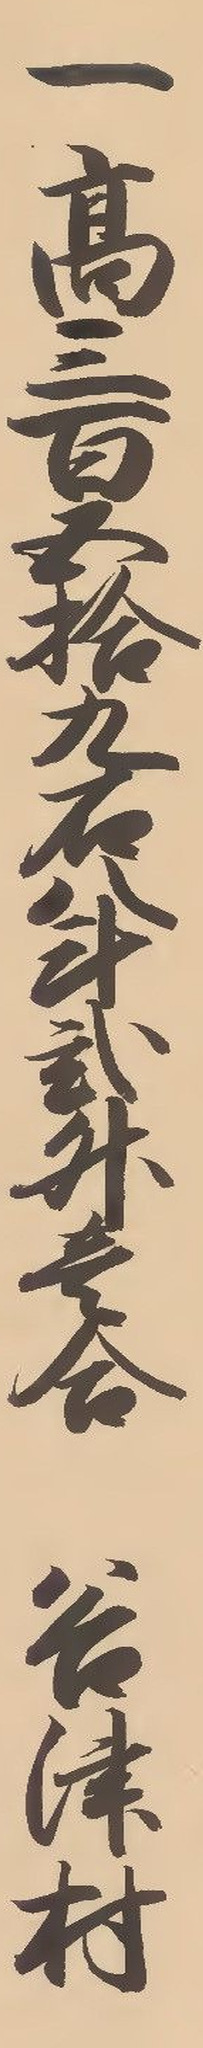一高三百五拾九石八斗弐升壱合谷津村
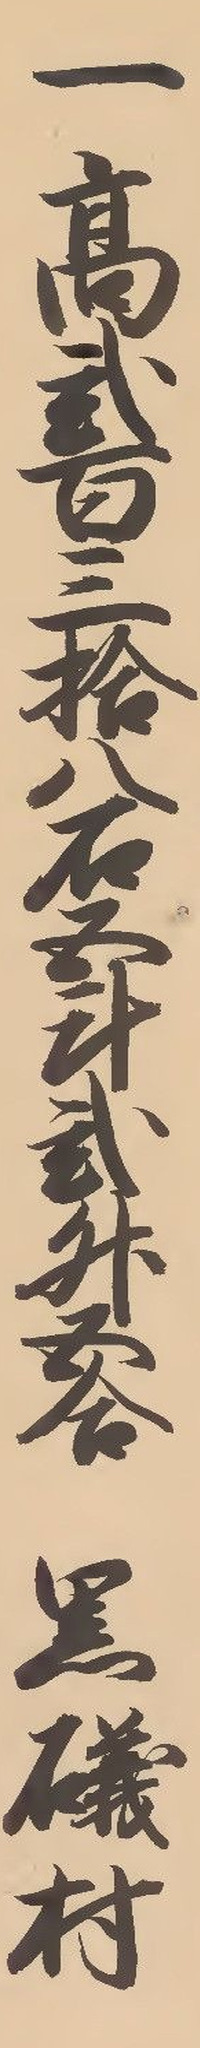一高弐百三拾八石五斗弐升五合黒磯村
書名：常陸国郷帳
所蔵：国立公文書館 National Archives of Japan
